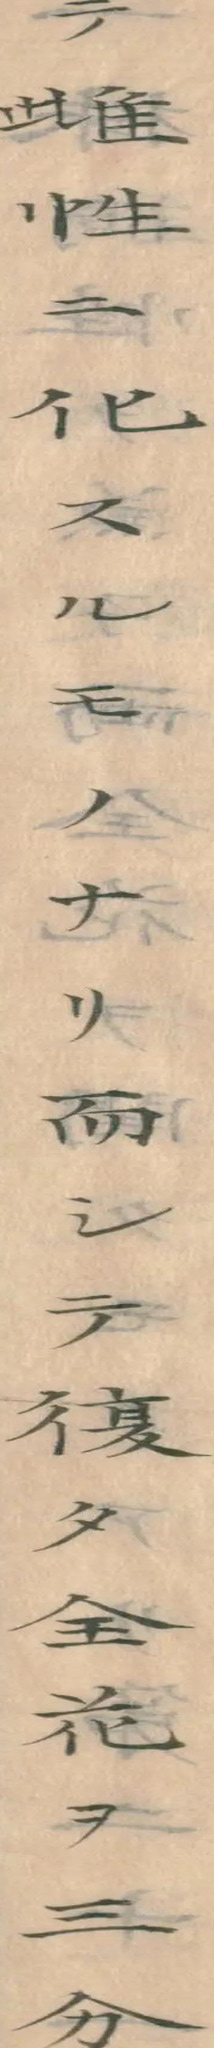テ雌性ニ化スルモノナリ而シテ復タ全花ヲ三分
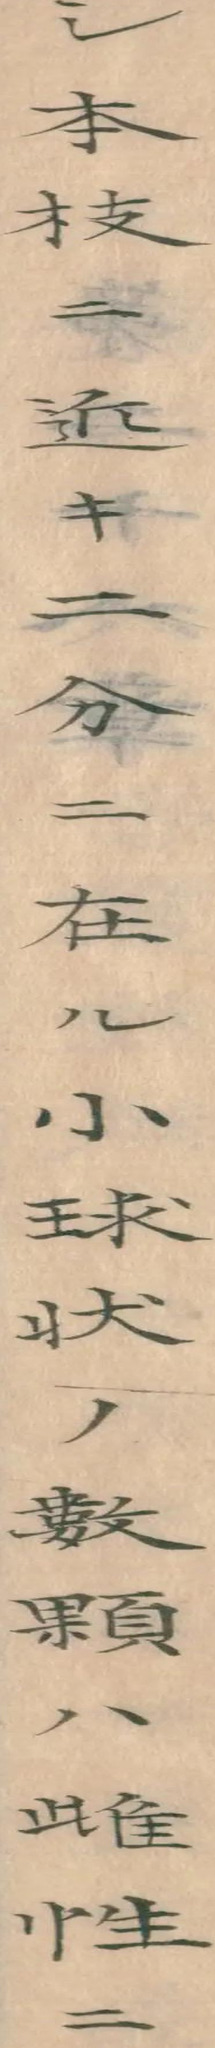シ本枝ニ近キ二分ニ在ル小球状ノ数顆ハ雌性ニ
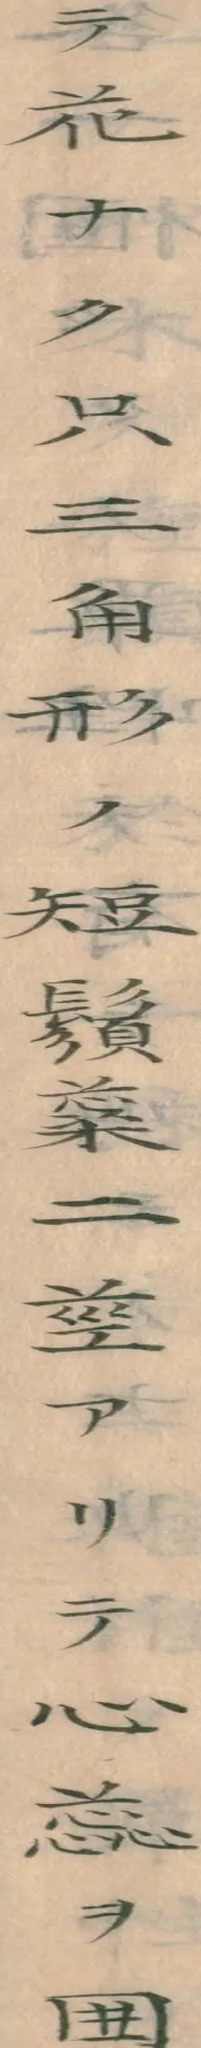テ花ナク只三角形ノ短鬚蘂二茎アリテ心蕊ヲ囲
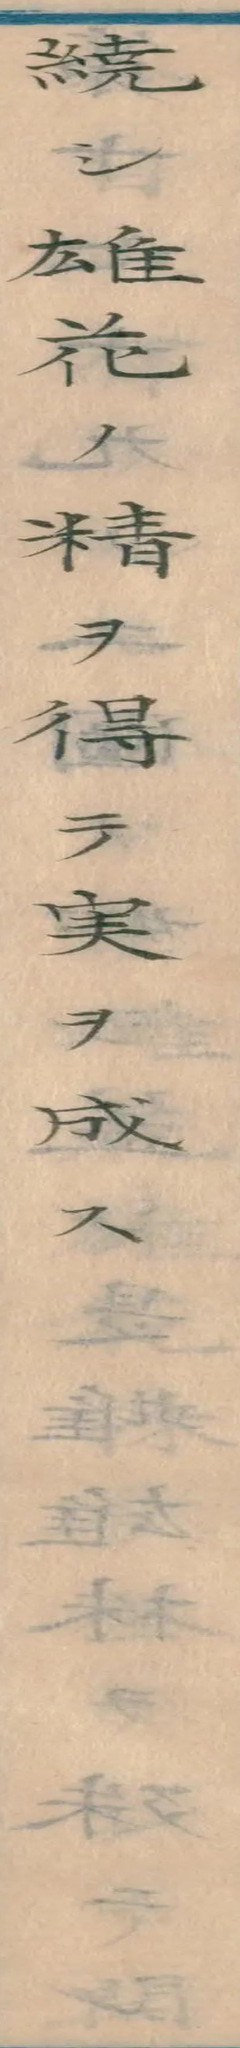繞シ雄花ノ精ヲ得テ実ヲ成ス
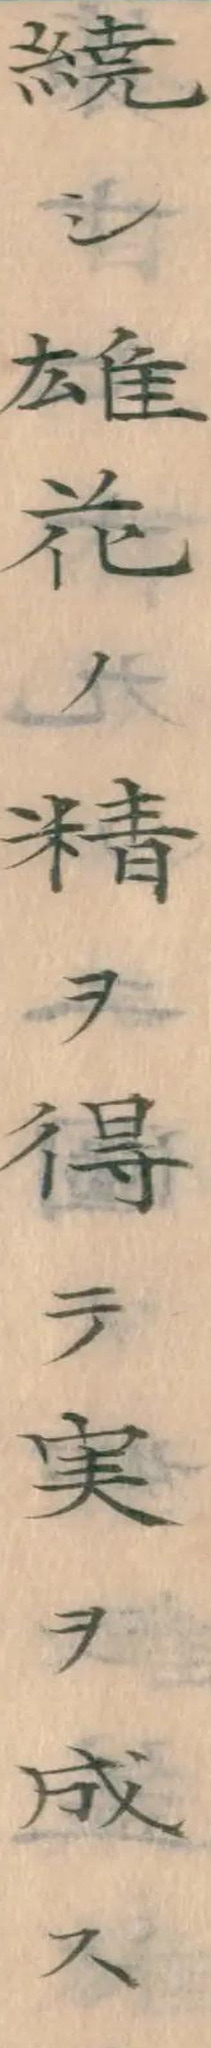繞シ雄花ノ精ヲ得テ実ヲ成ス
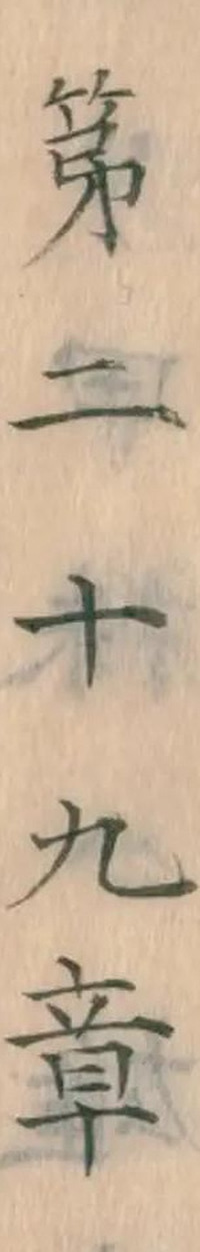第二十九章
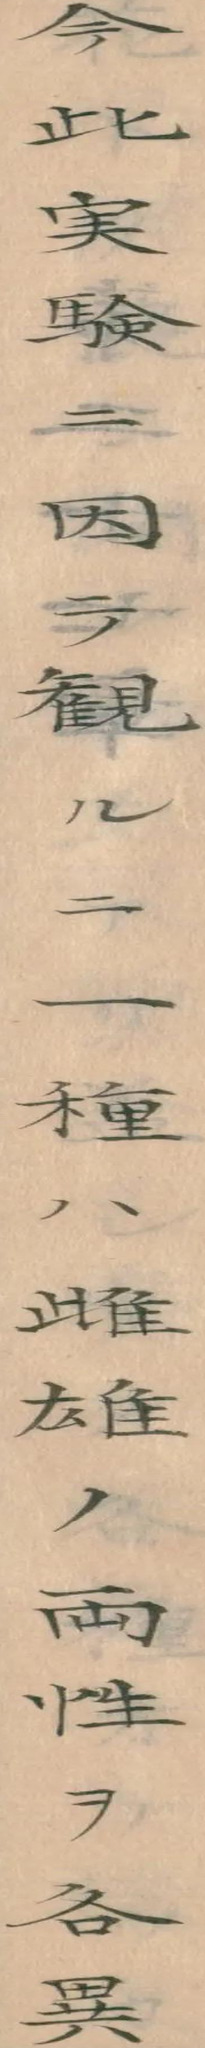今此実験ニ因テ観ルニ一種ハ雌雄ノ両性ヲ各異
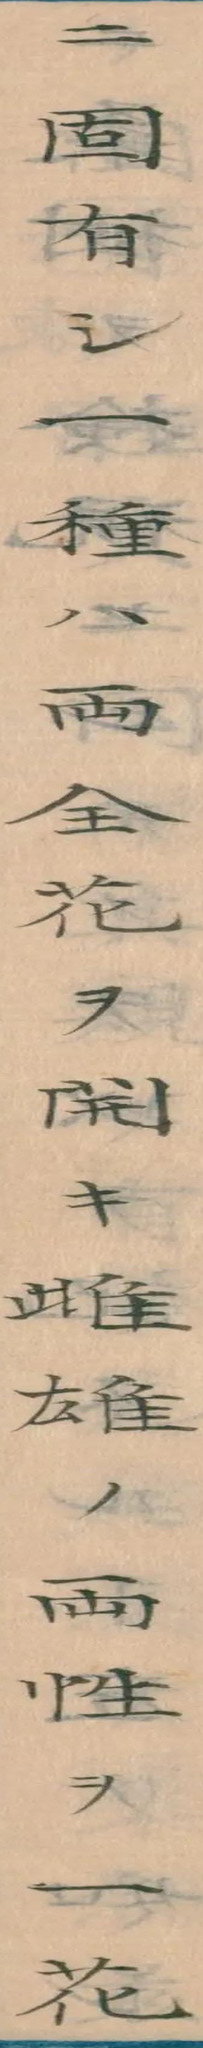ニ固有シ一種ハ両全花ヲ開キ雌雄ノ両性ヲ一花
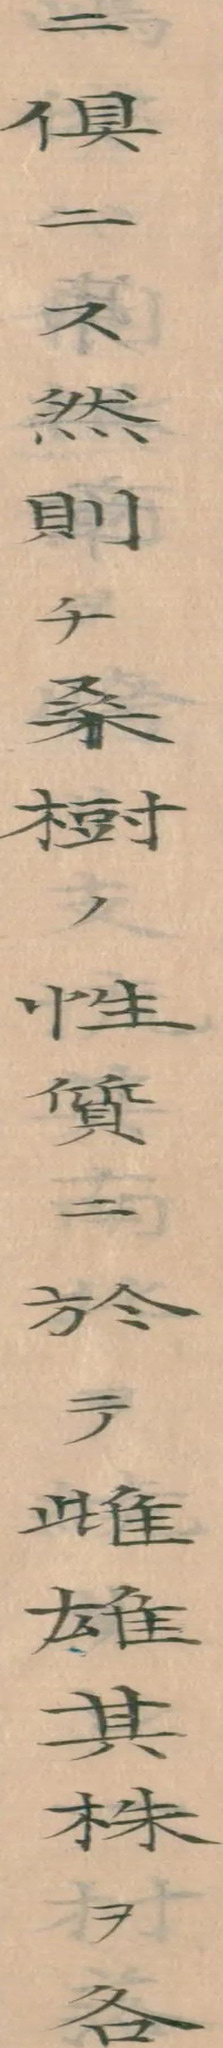ニ俱ニス然則チ桑樹ノ性質ニ於テ雌雄其株ヲ各
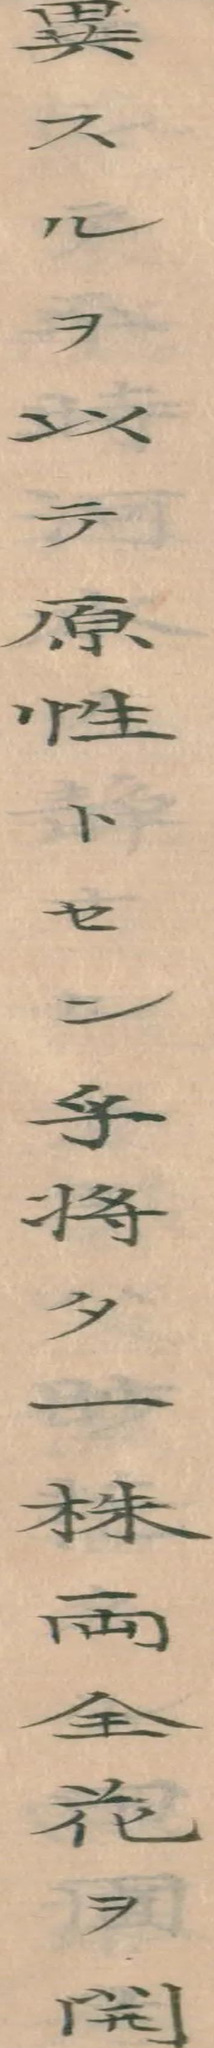異スルヲ以テ原性トセン乎将タ一株両全花ヲ開
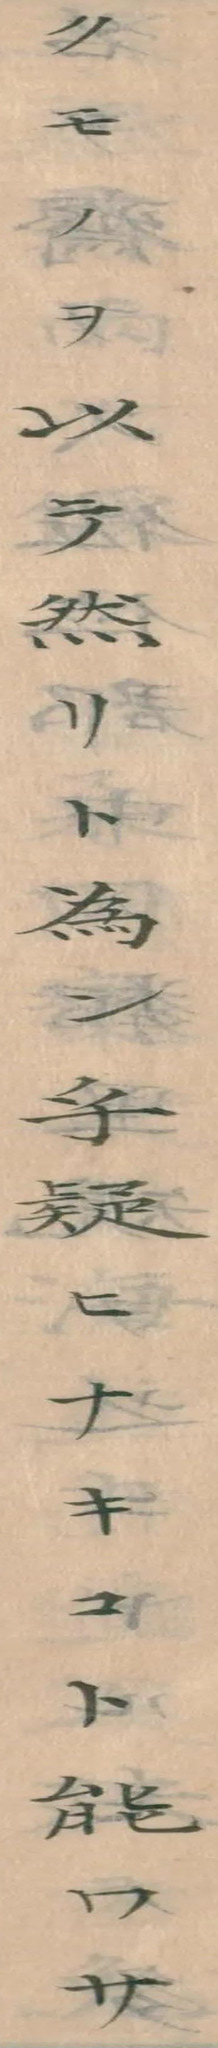クモノヲ以テ然リト為ン乎疑ヒナキコト能ワサ
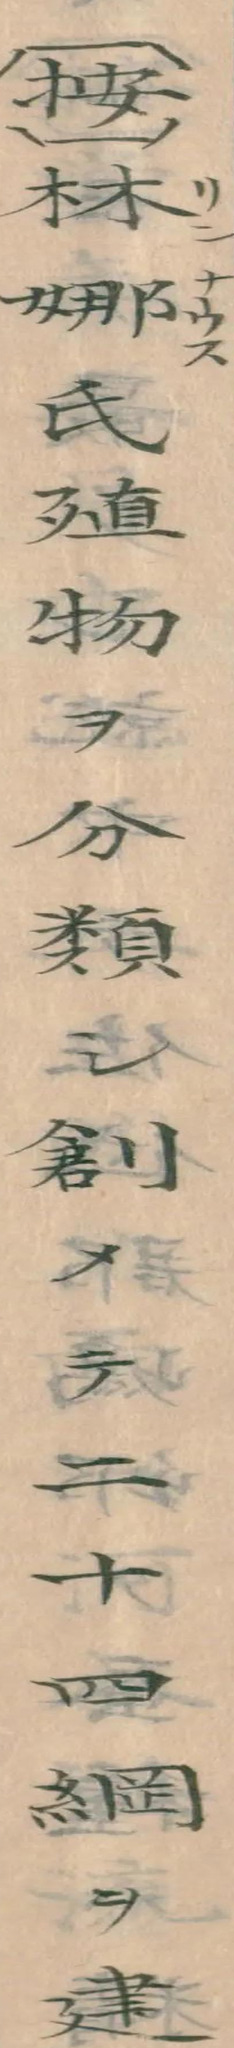[按]林娜氏殖物ヲ分類シ創メテ二十四綱ヲ建
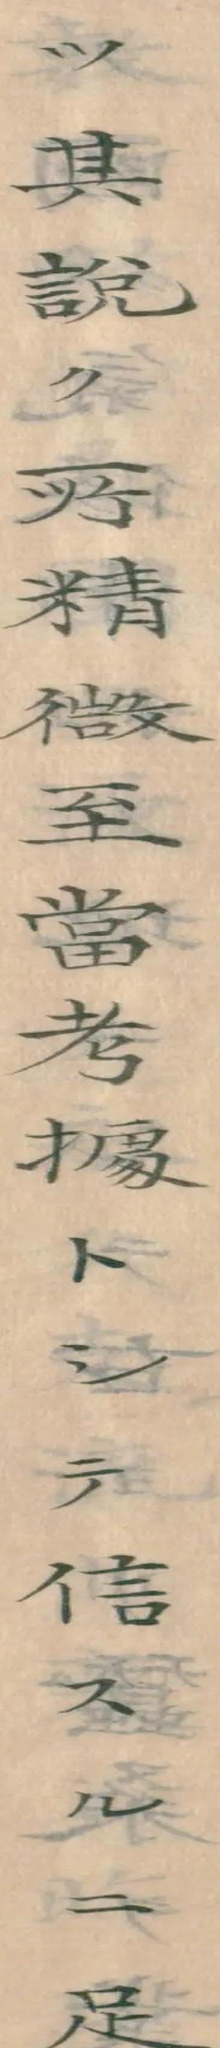ツ其説ク所精微至当考拠トシテ信スルニ足
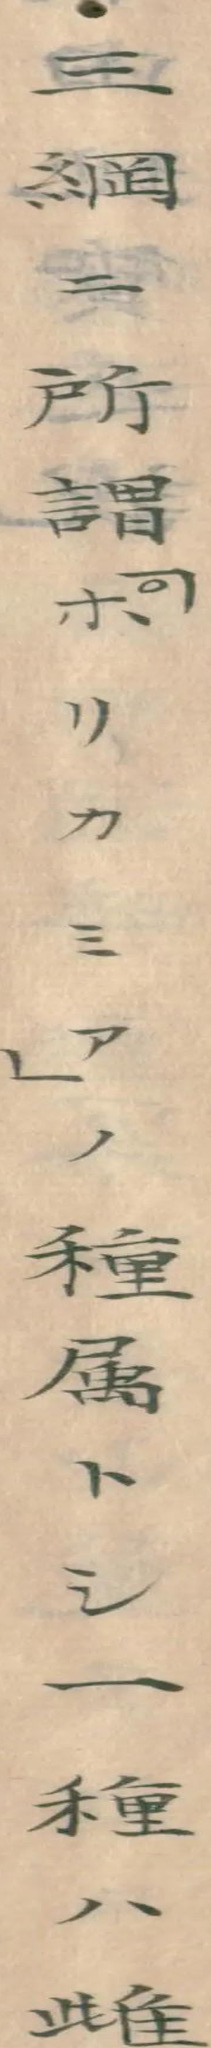三綱ニ所謂「ポリカミア」ノ種属トシ一種ハ雌
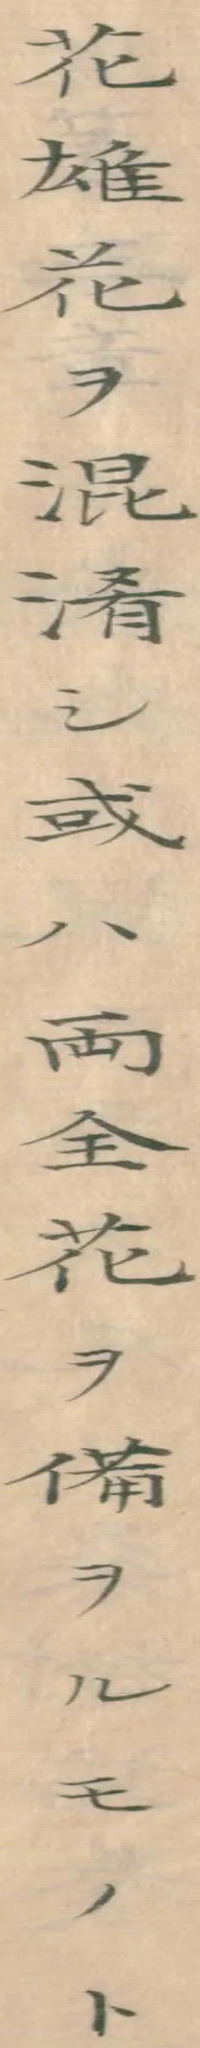花雄花ヲ混淆シ或ハ両全花ヲ備ヲルモノト
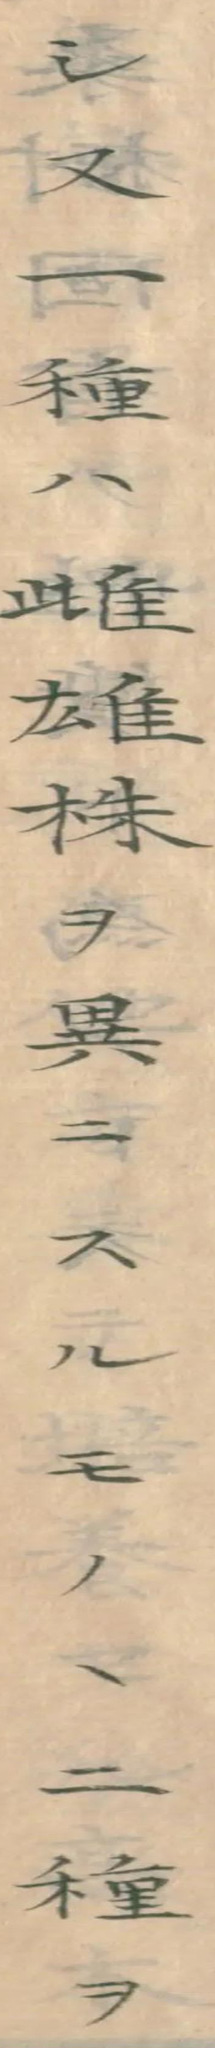シ又一種ハ雌雄株ヲ異ニスルモノヽ二種ヲ
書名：蚕桑集成
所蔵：国立国会図書館 National Diet Library, JAPAN
